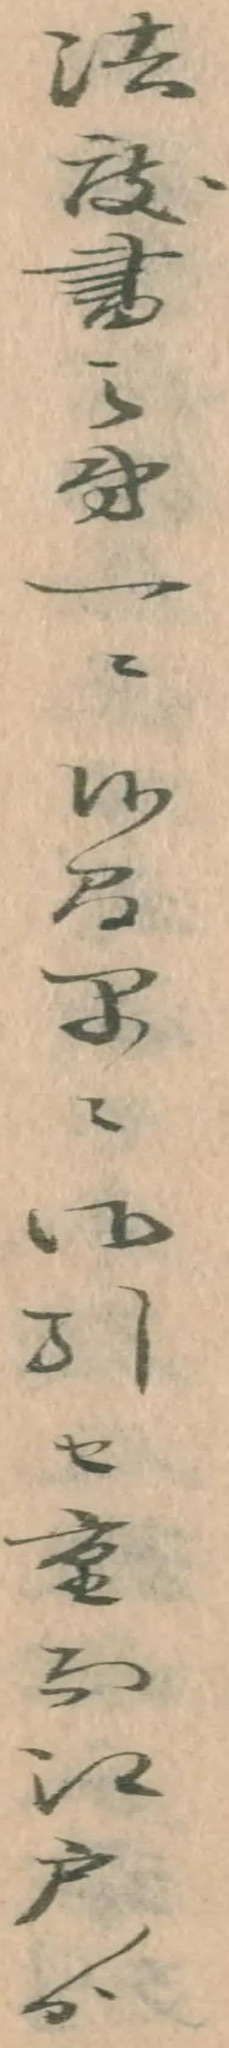法度書之第一に候間早々御引せ重而江戸ゟ
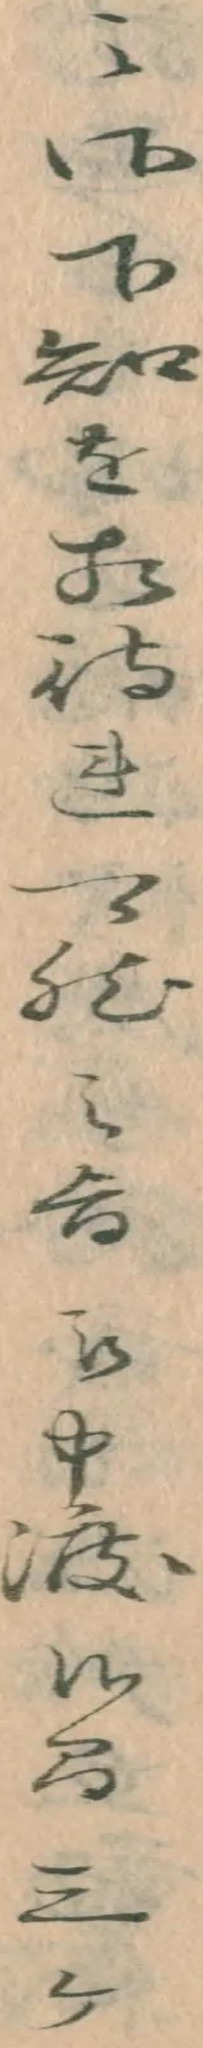之御下知を相待連可然之旨被申渡候間三ケ
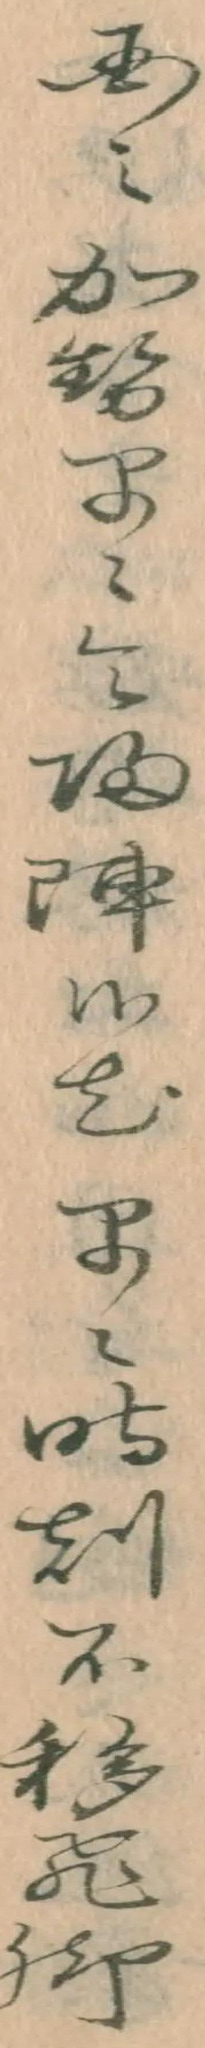国之加勢早々令帰陣候尤早々時刻不移飛脚
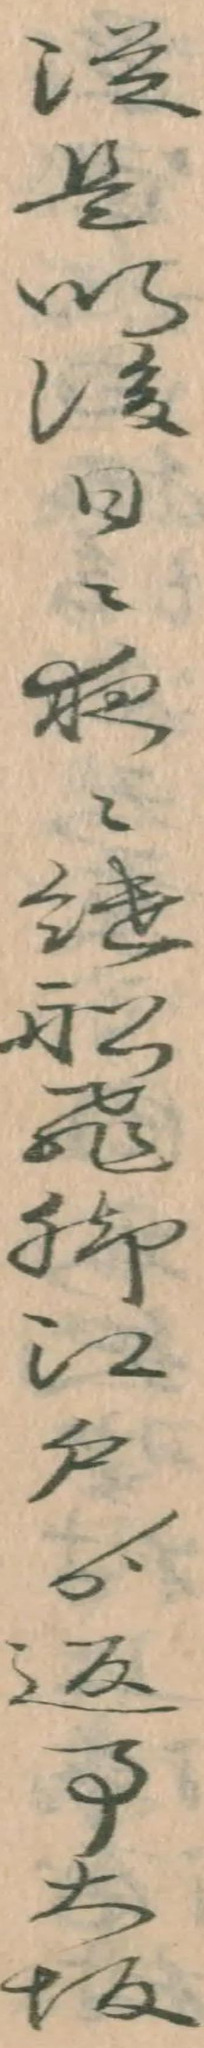従是以後日に夜に鑓舩飛脚江戸ゟ返事大坂
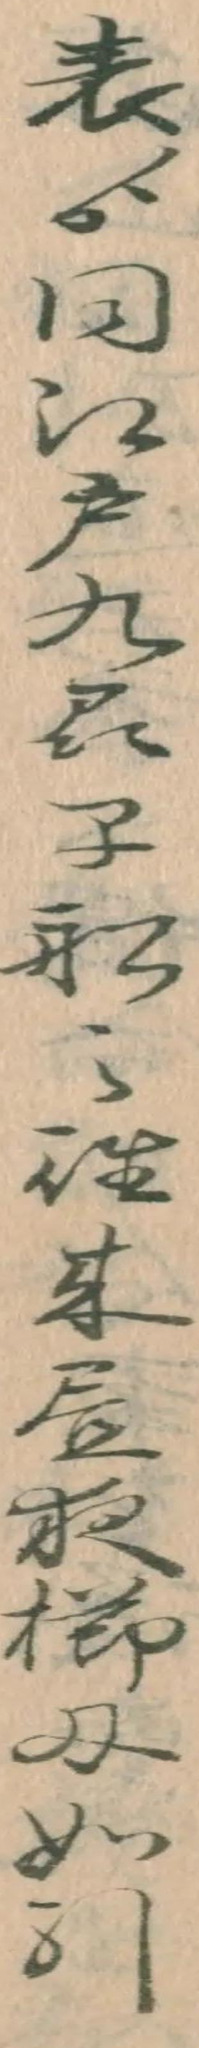表ゟ同江戸九州早船之往来昼夜櫛舟如引
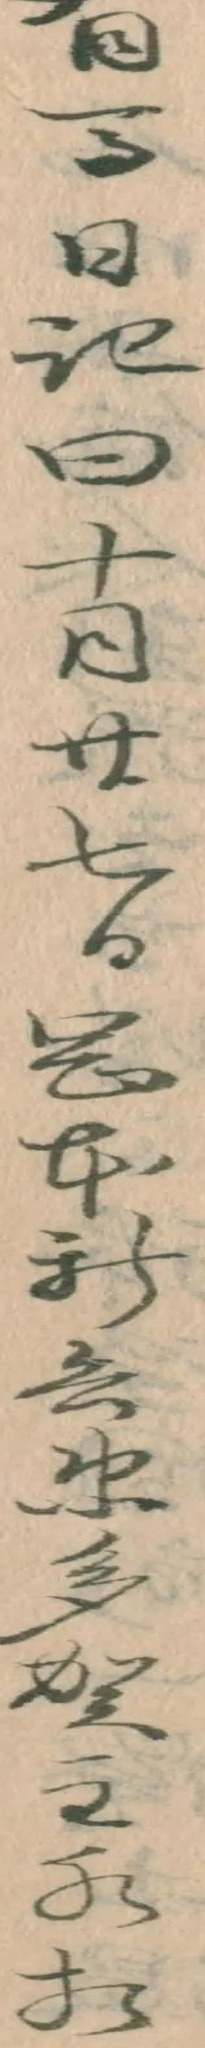有馬日記曰十月廿七日岡本新兵衛多賀主水相
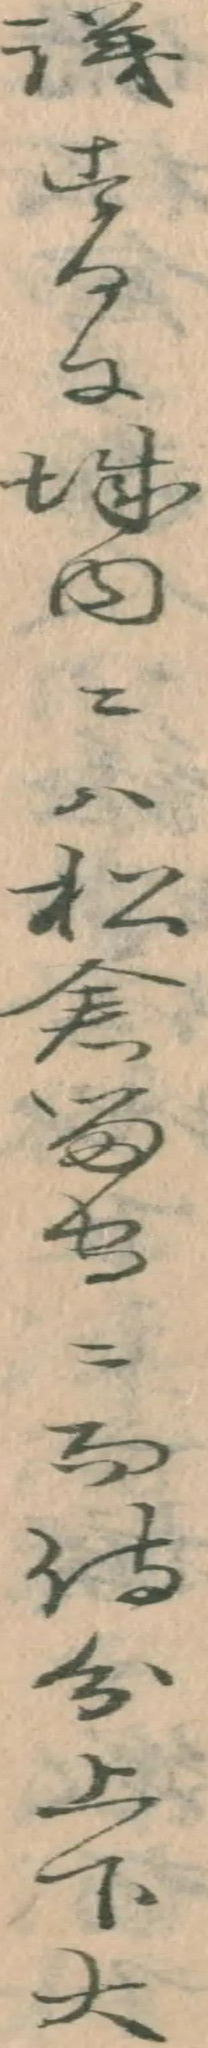議春る尓城内には松倉留守に而侍分上下大
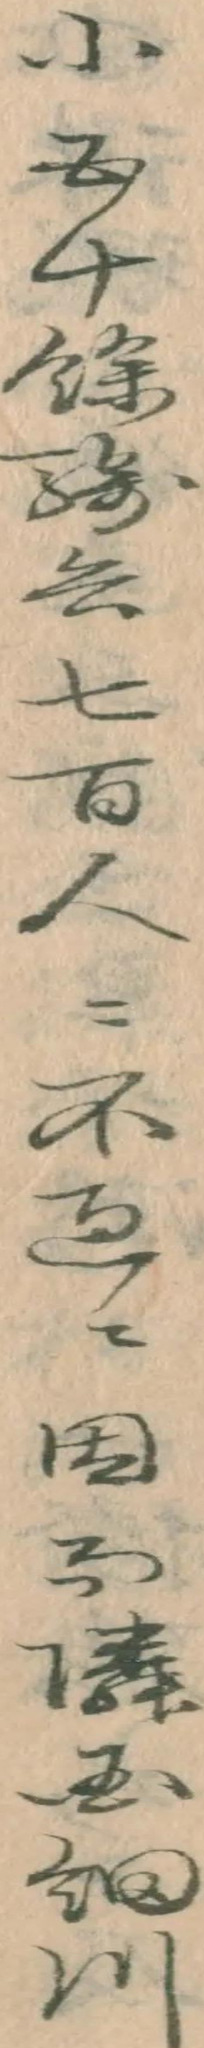小五千余騎兵七百人に不過に因而隣国細川
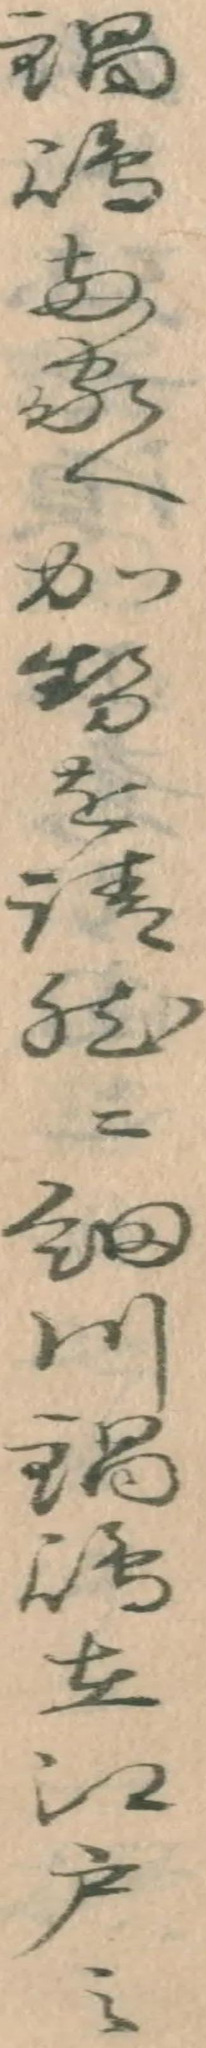鍋島両家へ加勢を請然に細川鍋島在江戸之
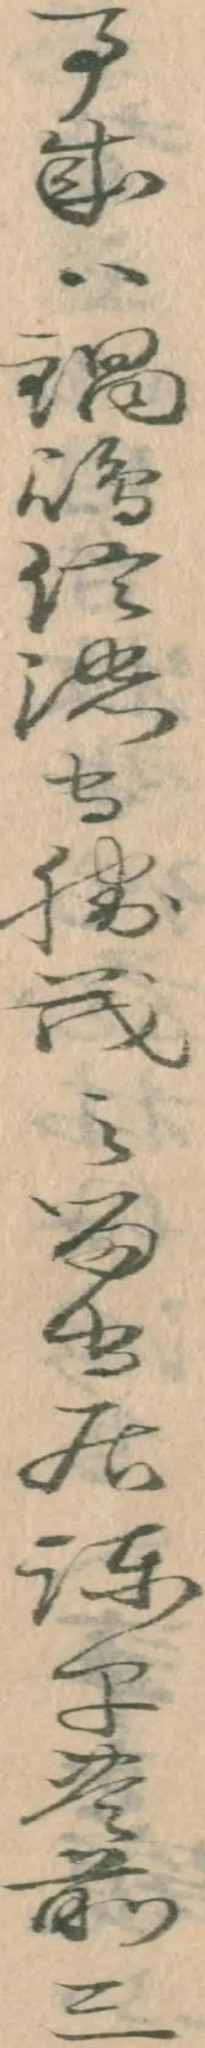事成は鍋島信濃守勝茂之留守居諫早豊前三
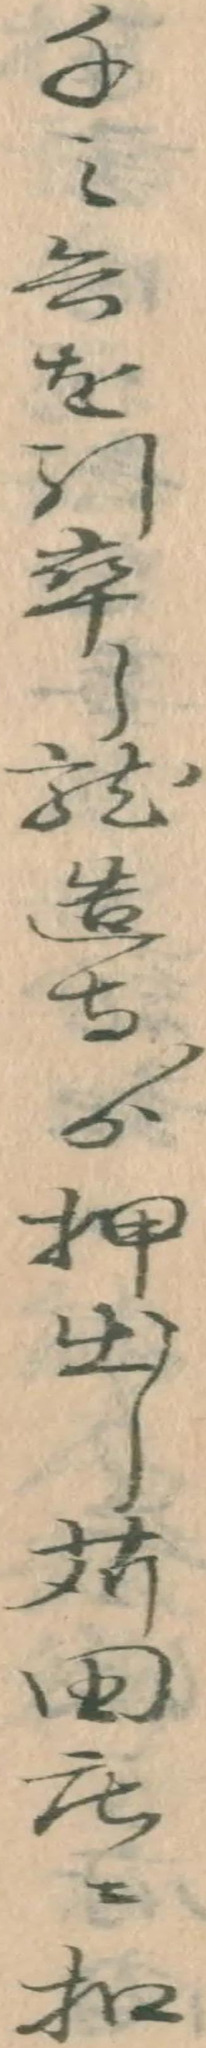千之兵を引率し龍造寺ゟ押出し苅田庄に扣
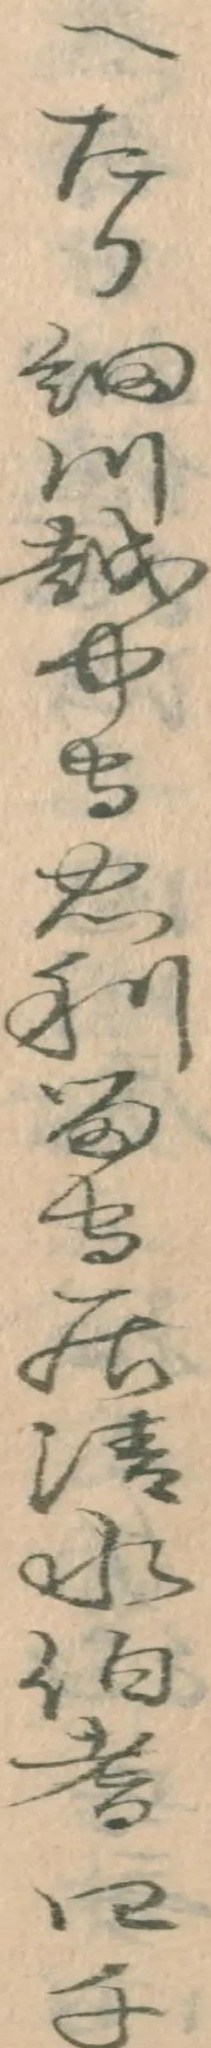へたり細川越中守忠利留守居清水伯耆四千

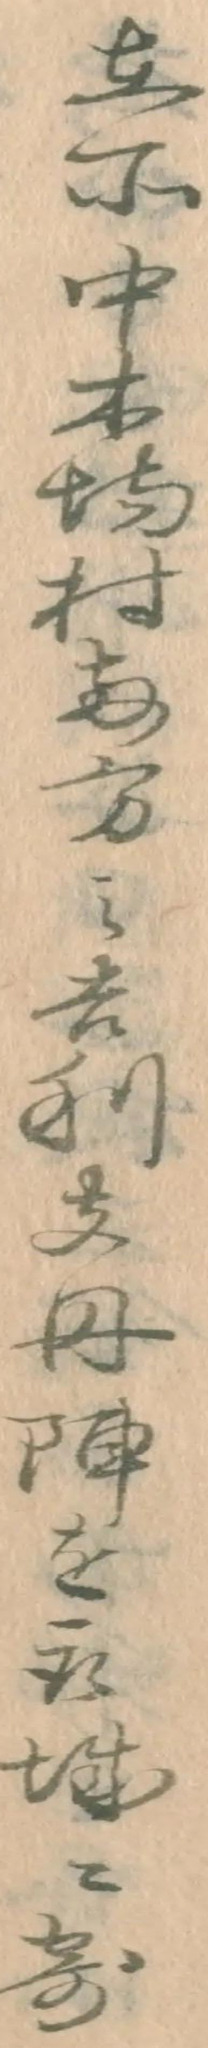在所中木場村両方之吉利支丹陣を取城に寄
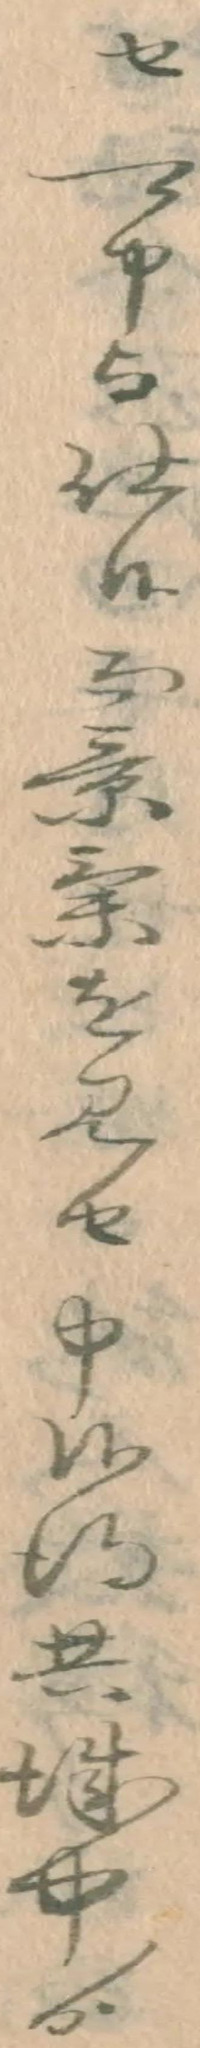せ可申与仕候而景気を見せ申候得共城中ゟ
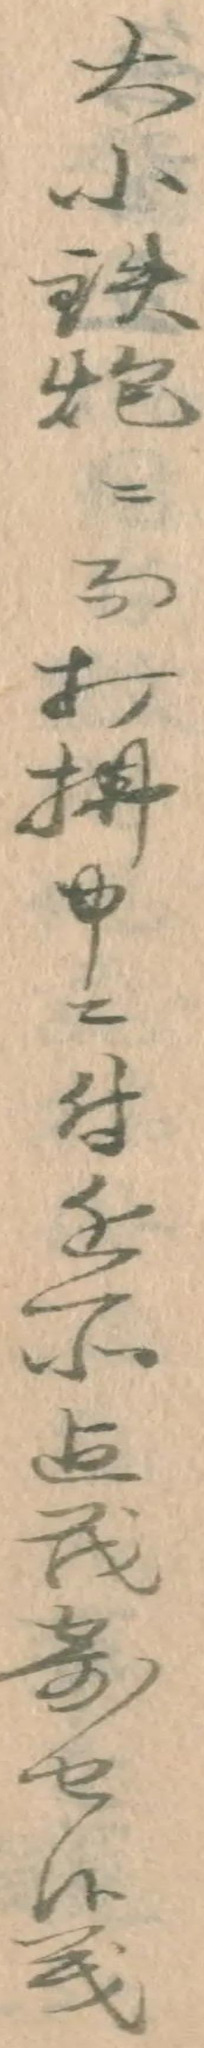大小鉄炮に而打払申に付近所迄茂寄せ候義
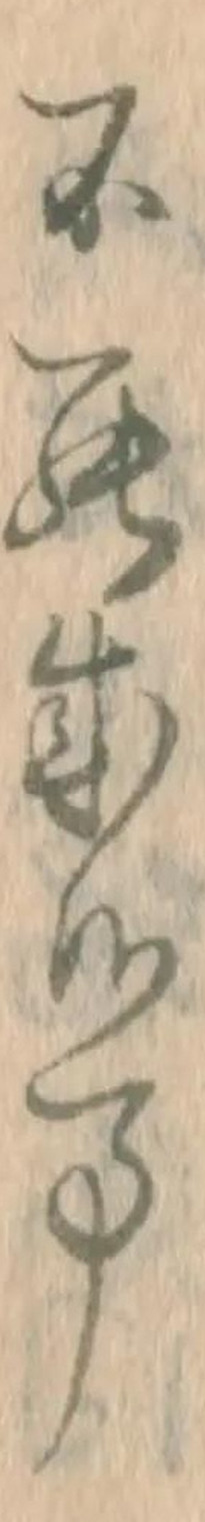不罷成候事
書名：切支丹御退治記 49巻. [2]
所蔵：国立国会図書館 National Diet Library, JAPAN
